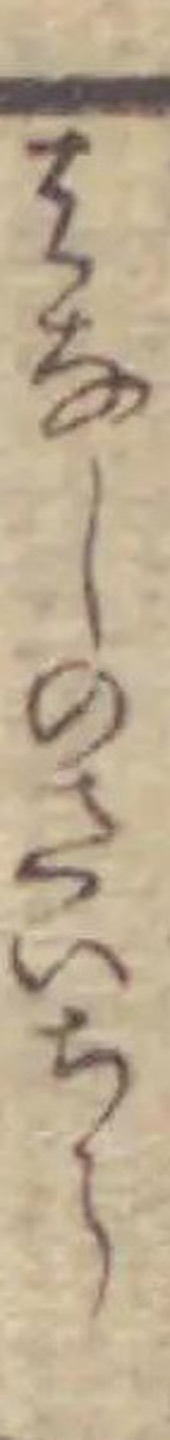はなしのさいちう
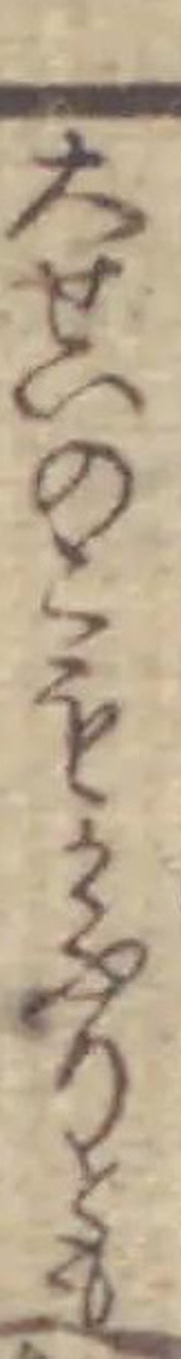大せいのこもかふりとも
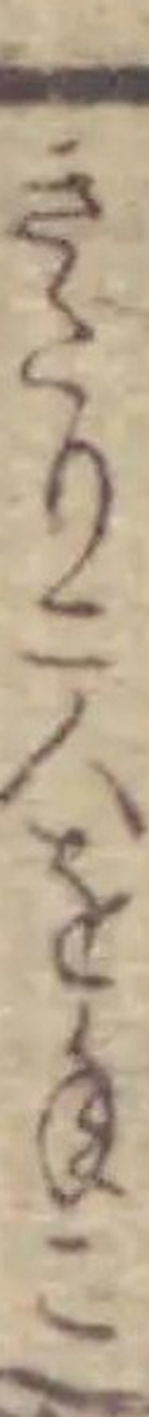きたり二人を手こ
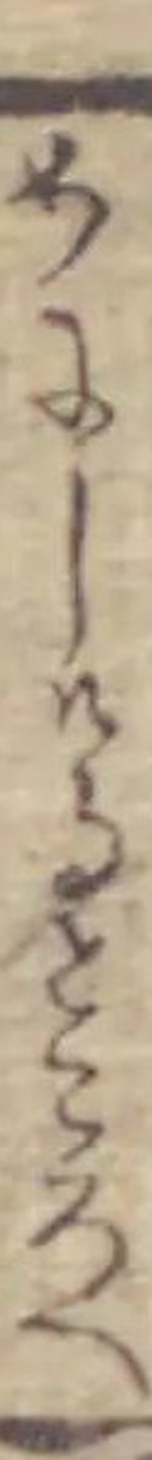めにしけるところへ
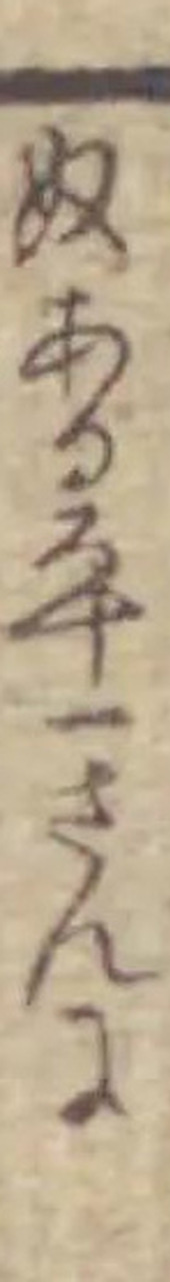奴ある平一さんに
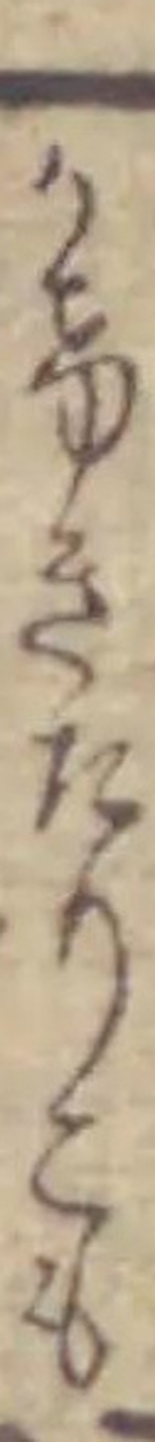かけきたりこも
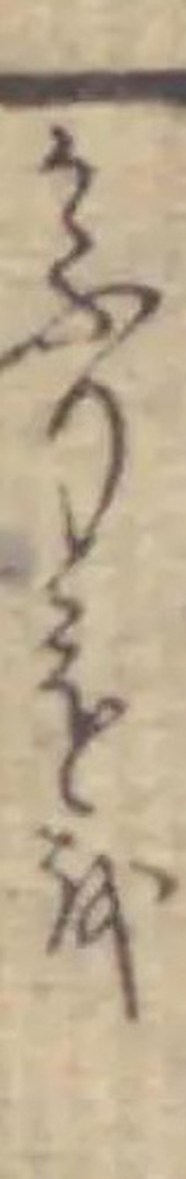かふりともを
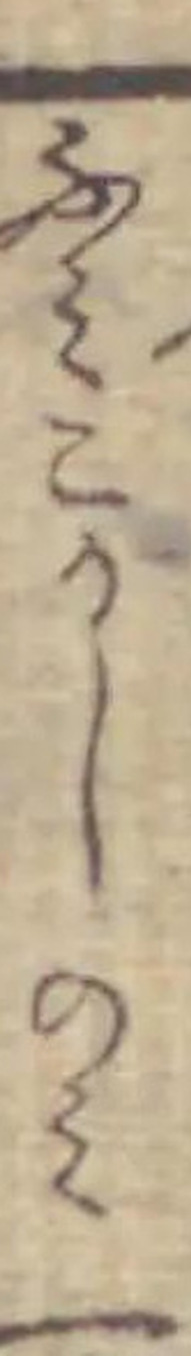ふみこかしのみ
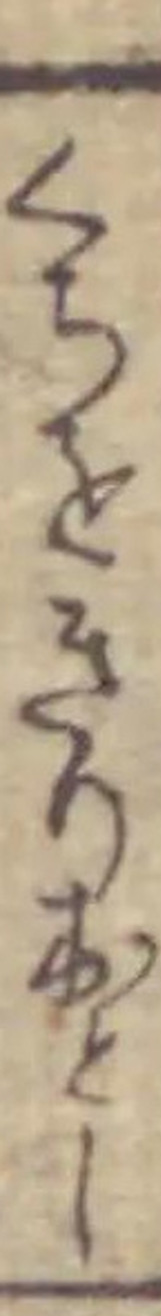くちをきりおとし
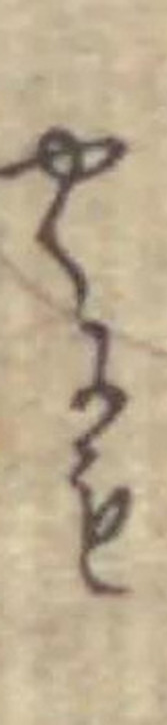やくにも
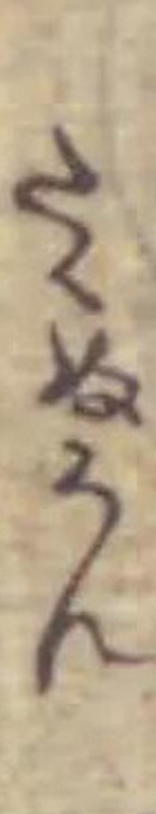たゝぬかん
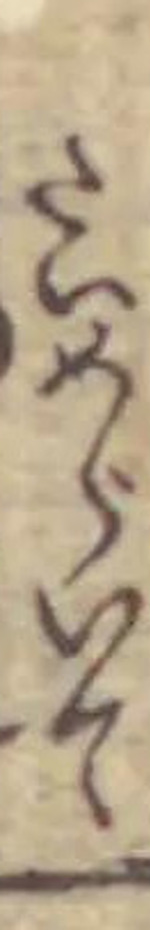たいめらいて
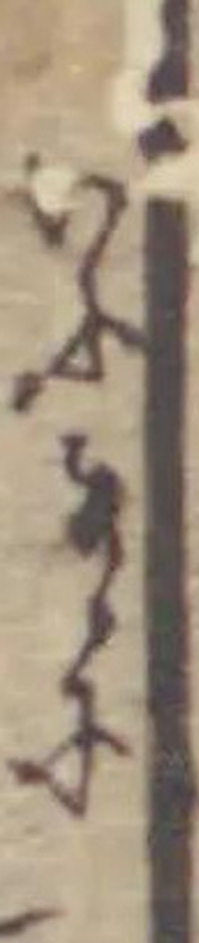いふなかに
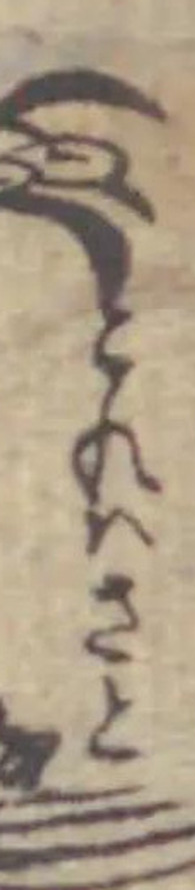これはさと
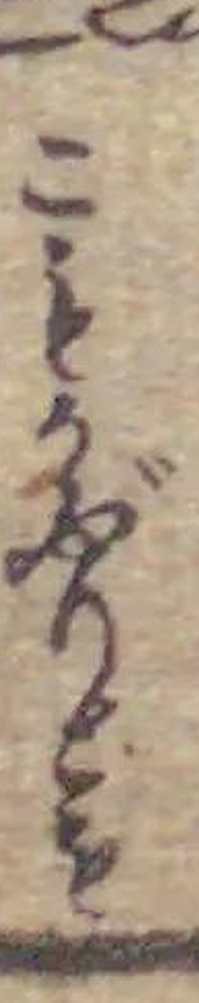こもかぶりこも
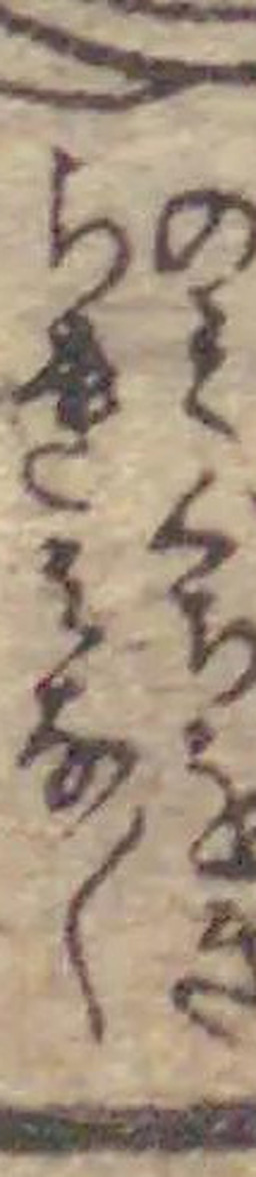られみな〳〵
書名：餅酒腹中能同志 2巻
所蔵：国立国会図書館 National Diet Library, JAPAN
